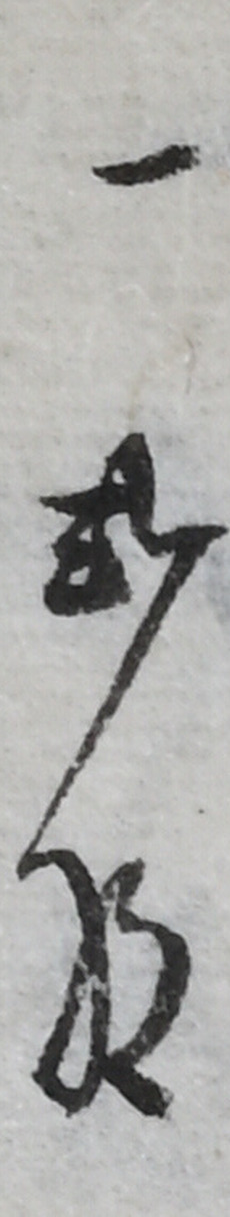一弐枚
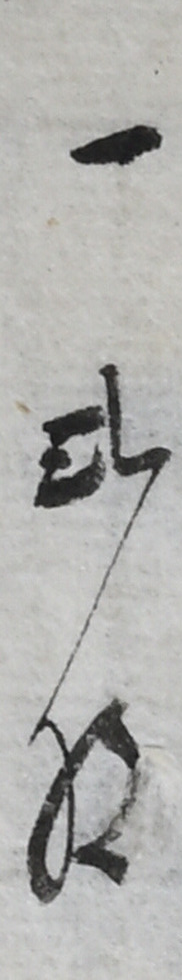一弐枚
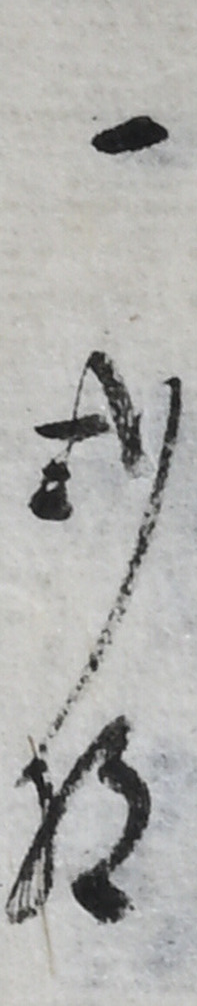一弐枚
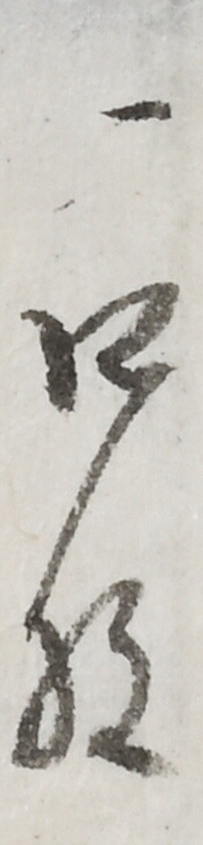一壱枚
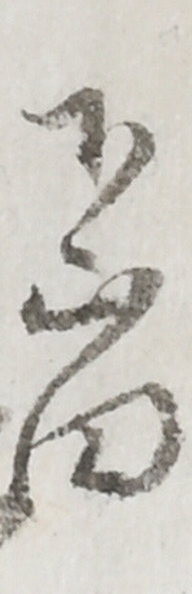下山田
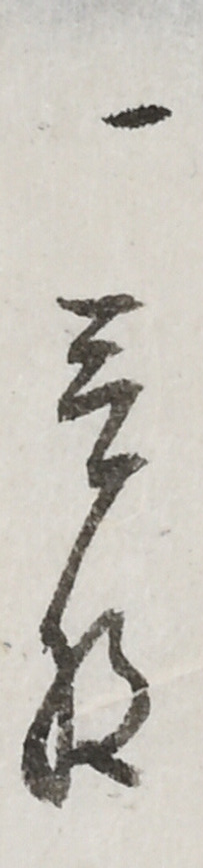一壱枚
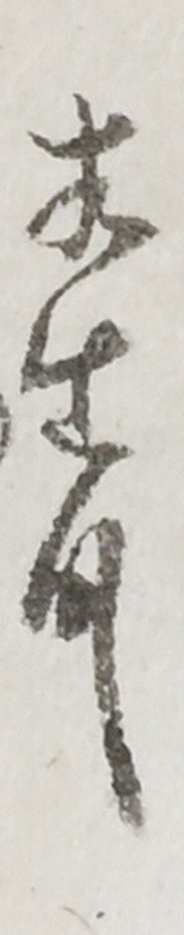相生町
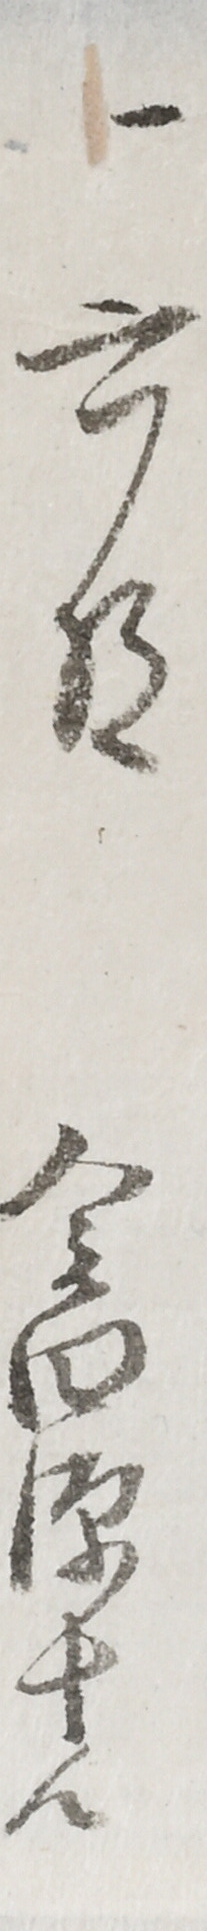一六枚金田源十八
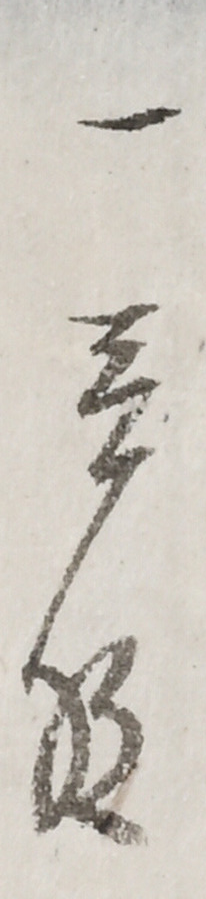一壱枚
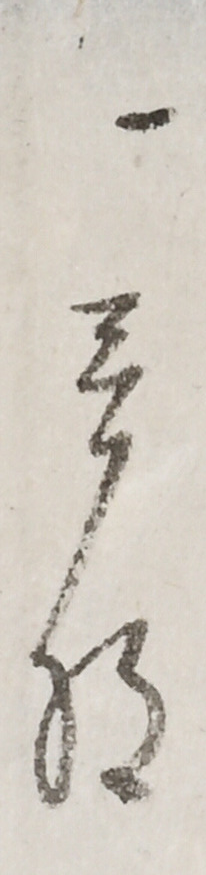一壱枚
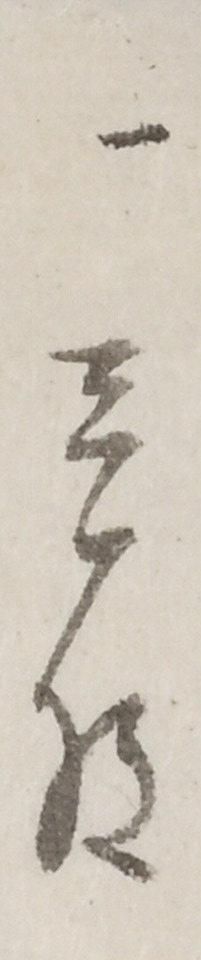一壱枚
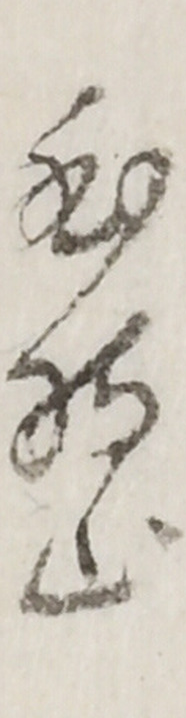非持山
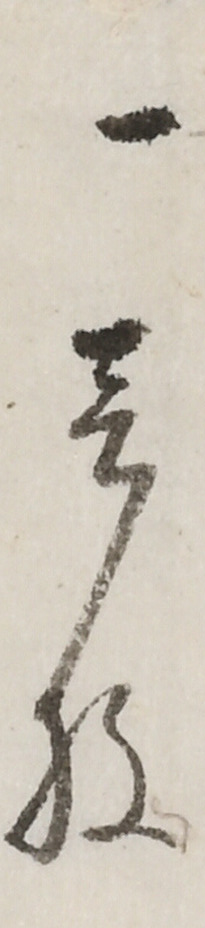一壱枚
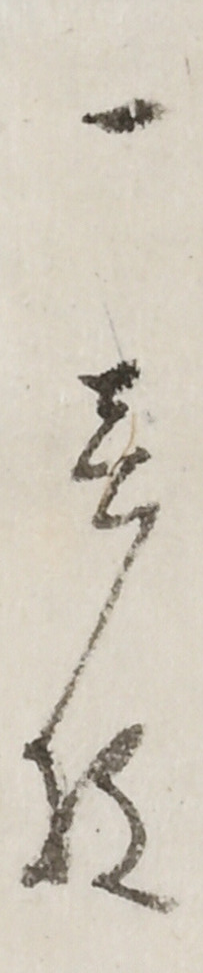一壱枚
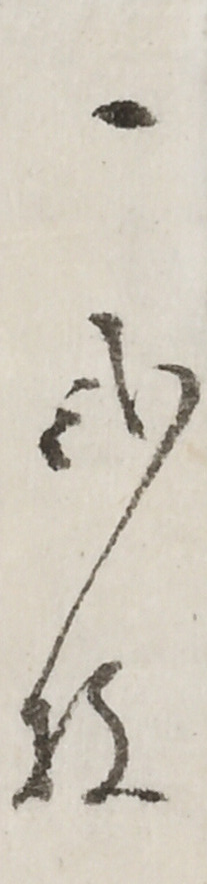一弐枚
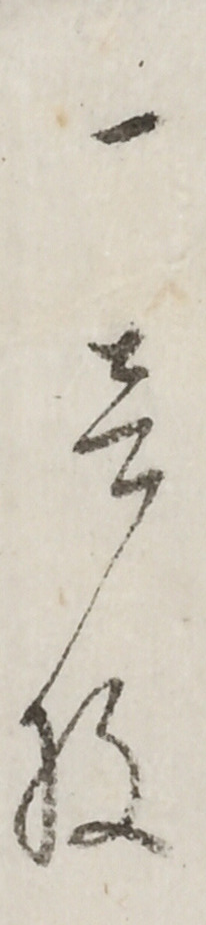一壱枚
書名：髙遠限楮幣引換覚帳
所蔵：伊那市立高遠町図書館・合同会社AMANE
